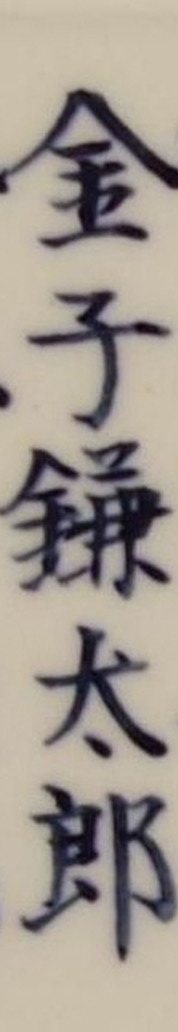金子鎌太郎
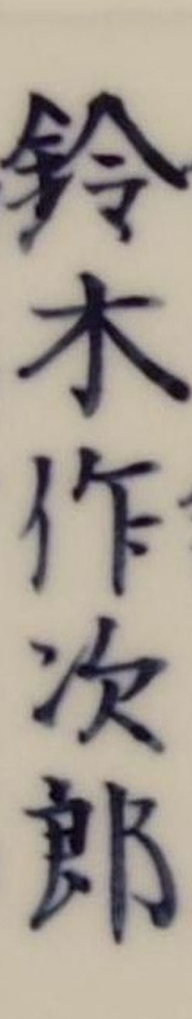鈴木作次郎
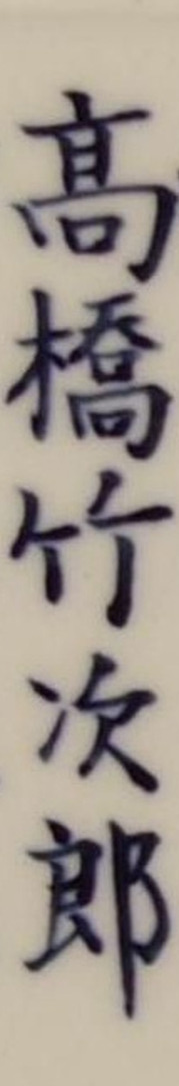高橋竹次郎
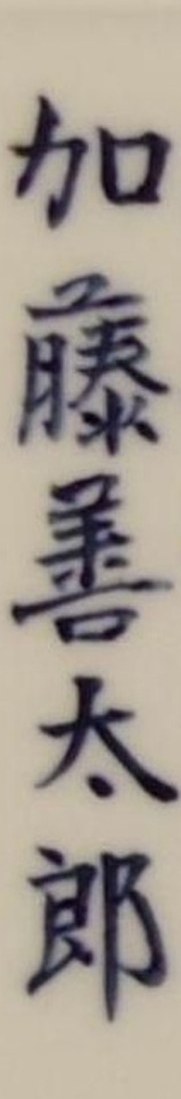加藤善太郎
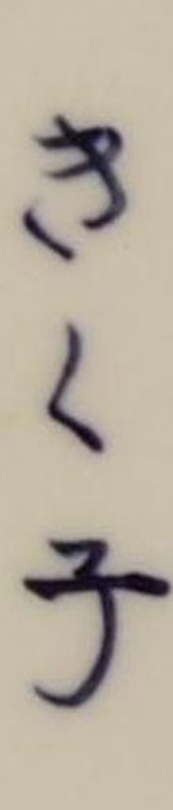きく子
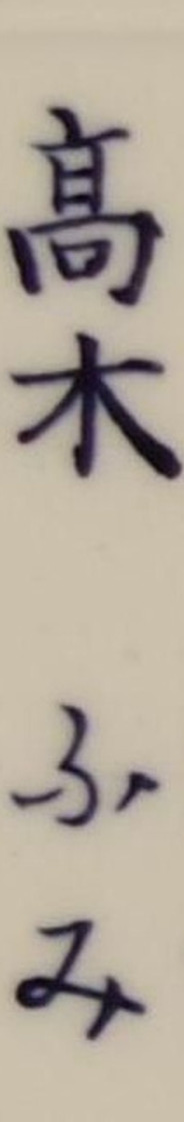高木ふみ
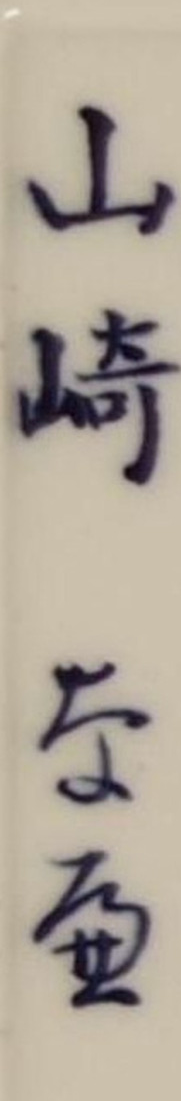山崎なへ

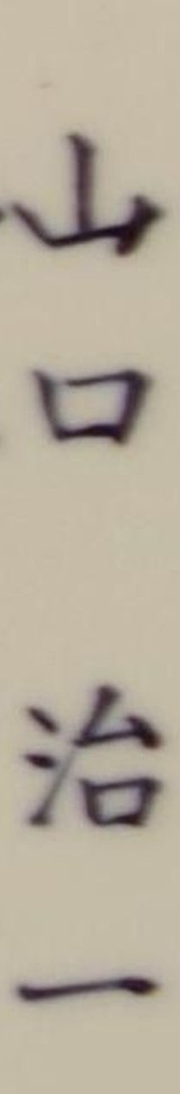山口治一
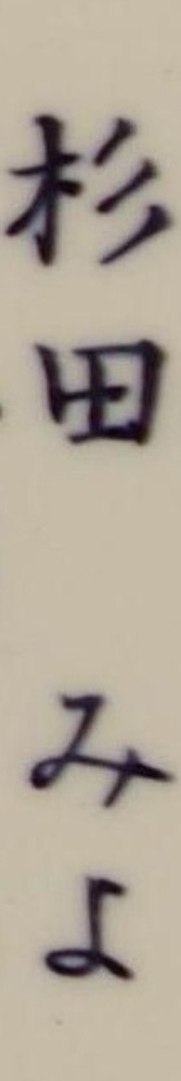杉田みよ
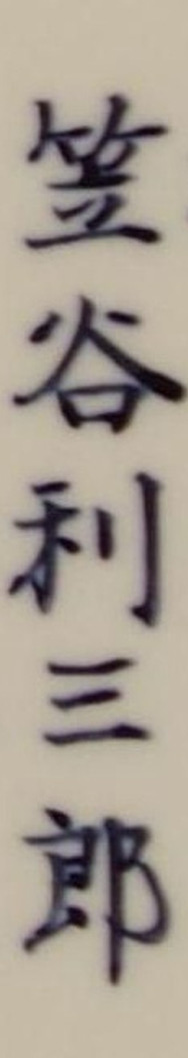笠谷利三郎
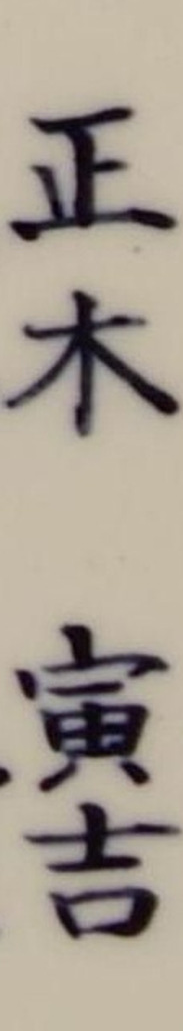正木寅吉
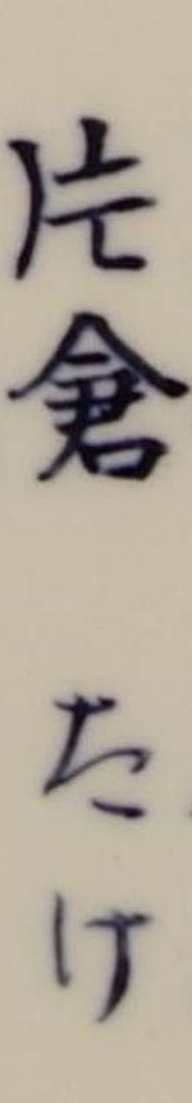片倉たけ
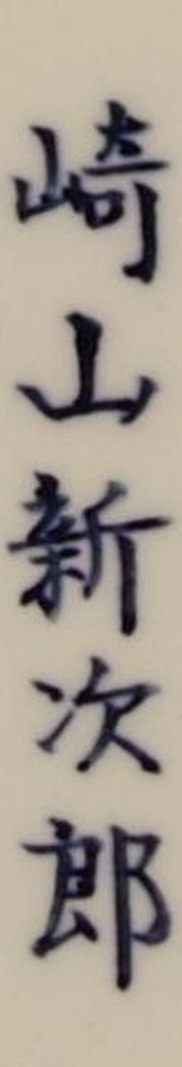崎山新次郎
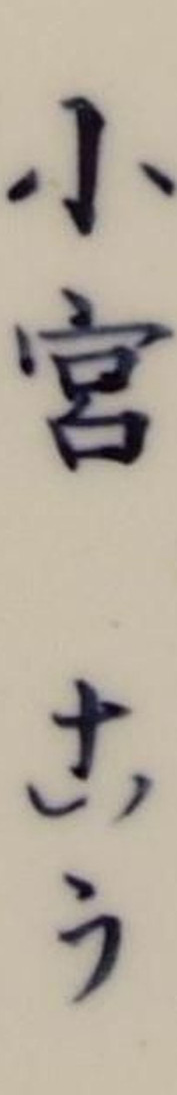小宮こう
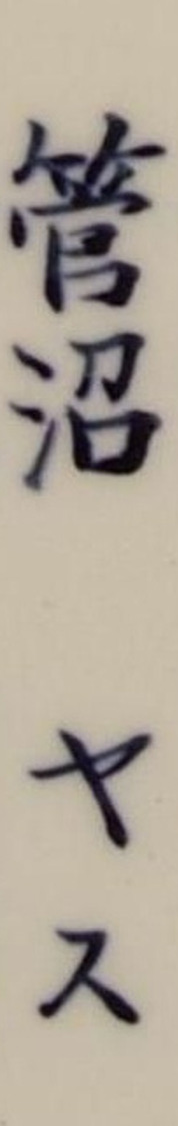管沼ヤス
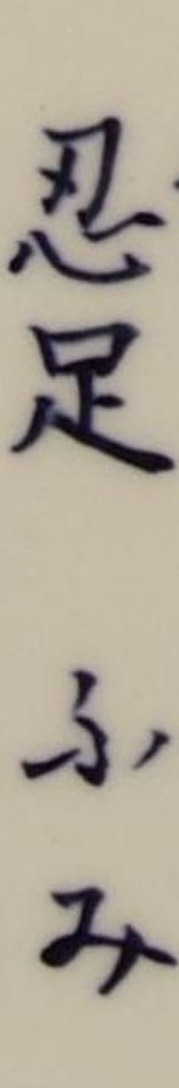忍足ふみ
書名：M~S
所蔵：高野山金剛峯寺
